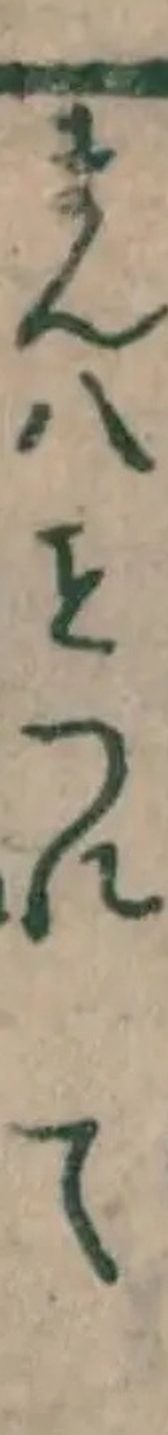まん八をつれて
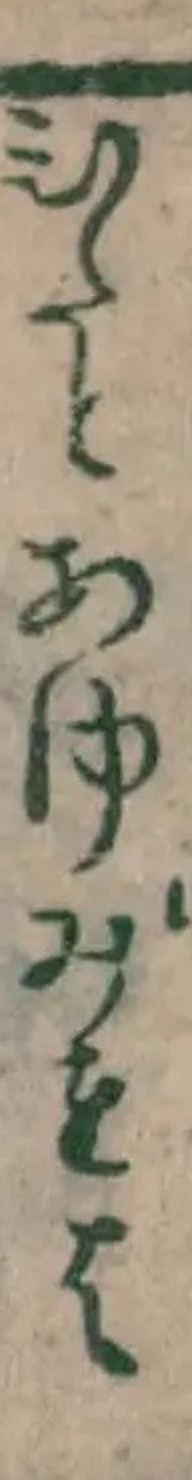ひたとあゆみをは
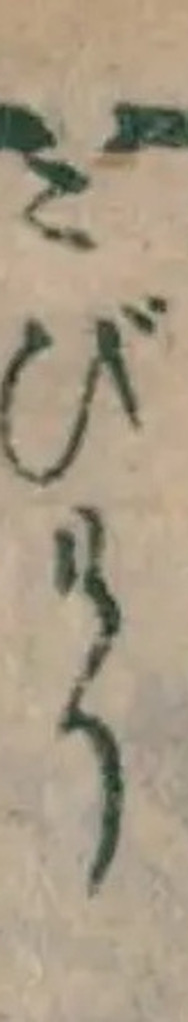こびけり
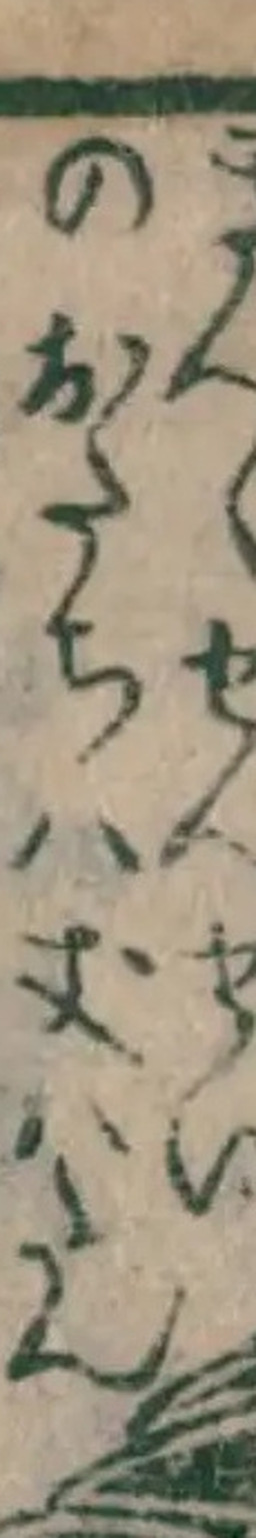の出たち八丈八たん
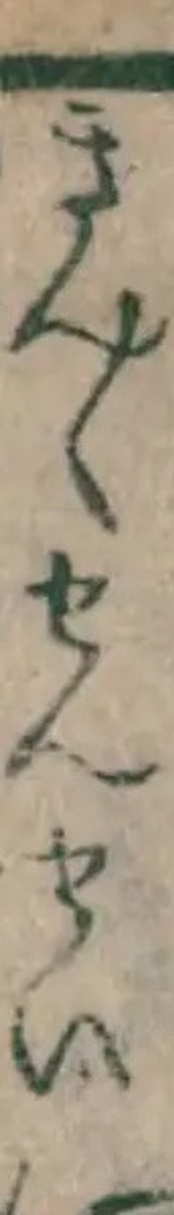きん〳〵せんせい
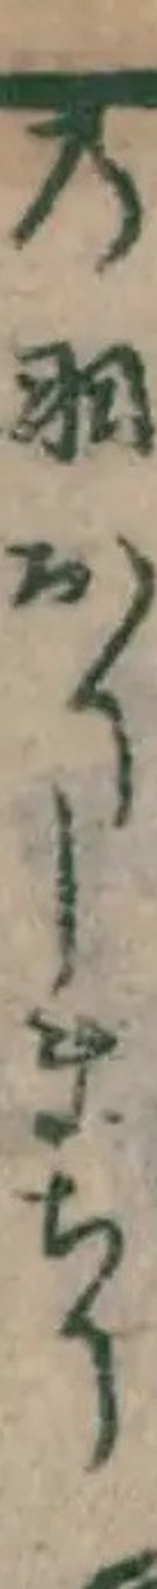の羽おりしまちり
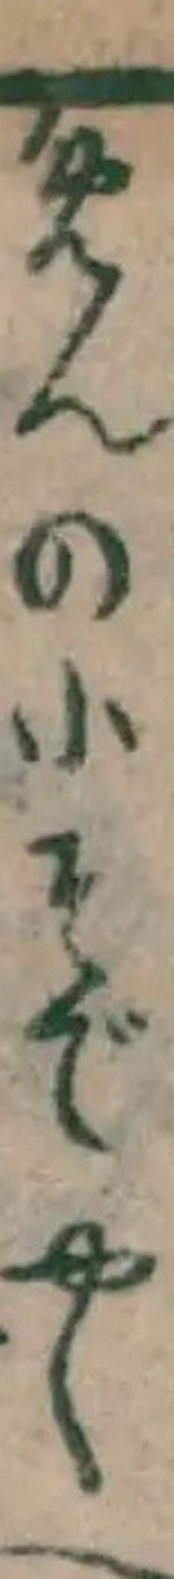めんの小そでやく
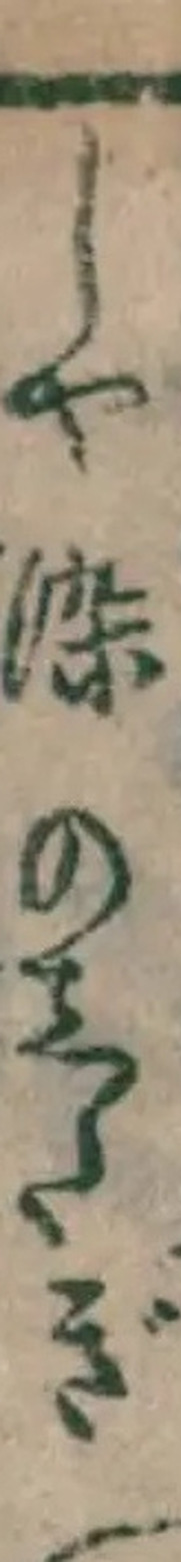しや染めのしたぎ
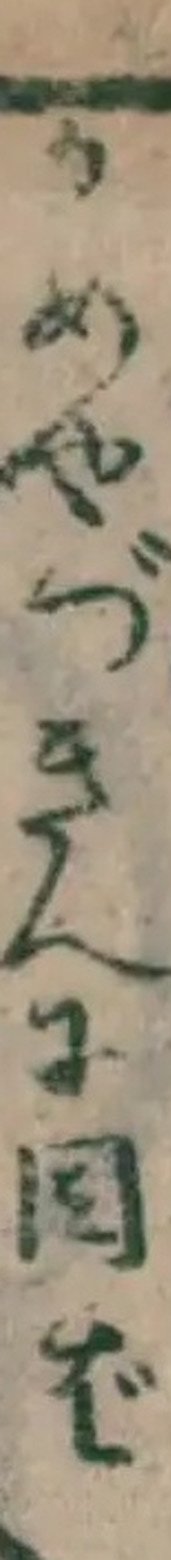かめやづきんに目ば
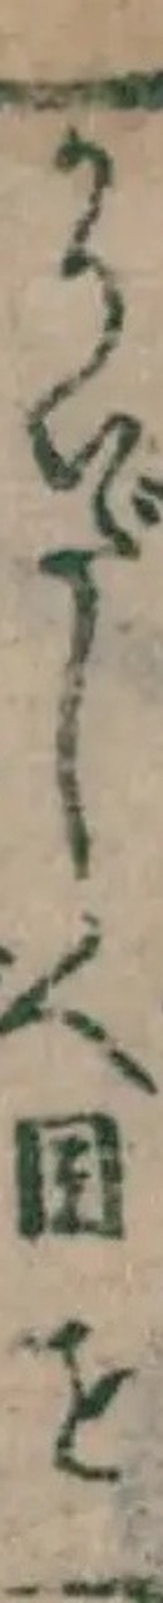かりいだし人目を
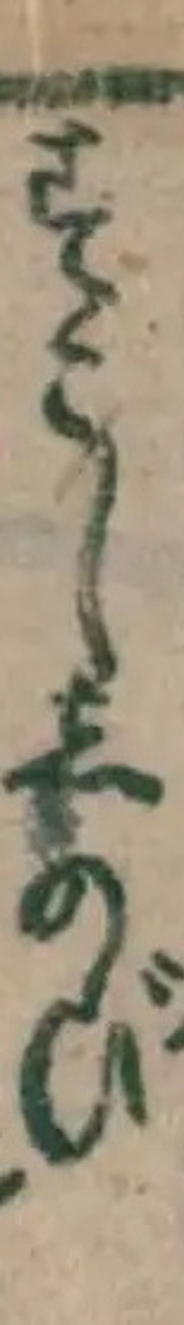すこししのび
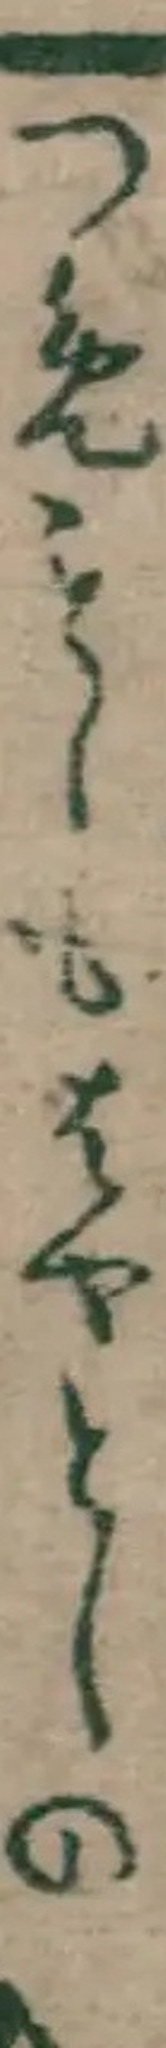つめことしもはやとしの
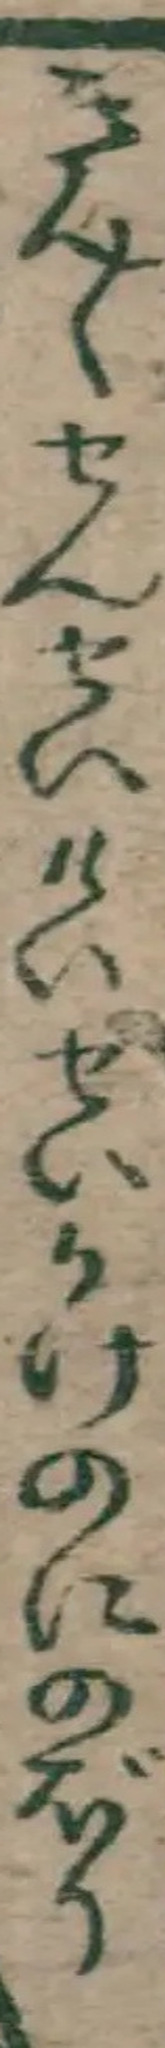きん〳〵せんせいけいせいかけのにのぼり
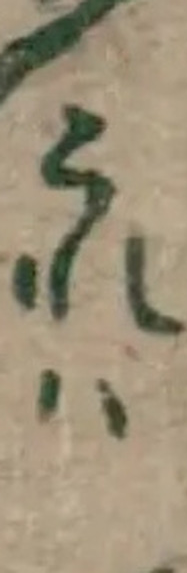これは
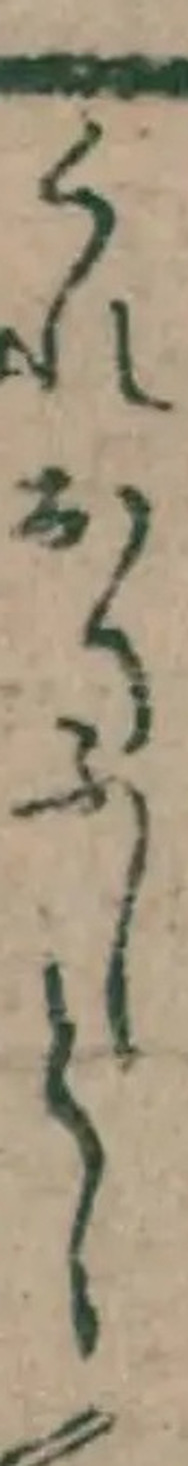くれおりふしとし
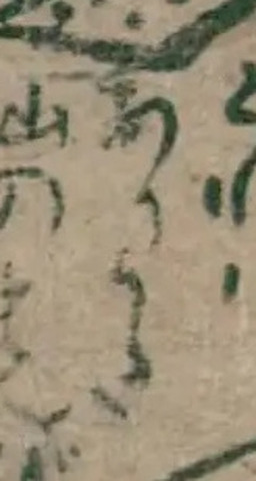ありかた
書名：金々先生栄花夢 : 2巻
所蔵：国立国会図書館 National Diet Library, JAPAN
